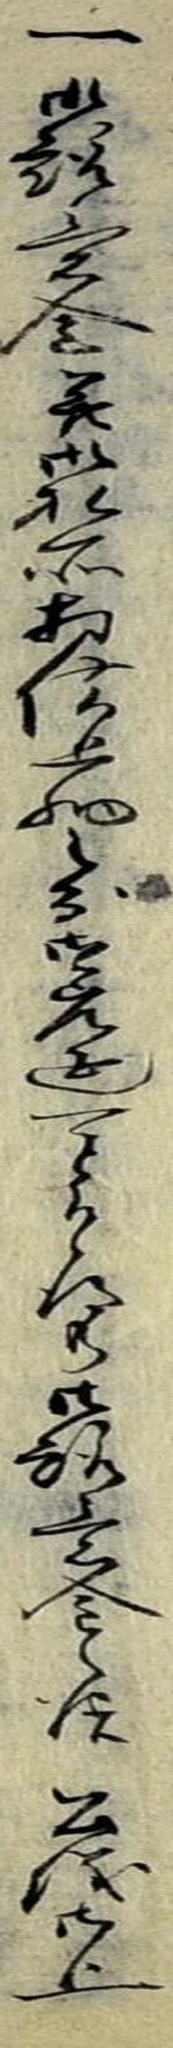一御趣意金并御札所拝借上納之分御差延可被下候得共御趣意金之儀は公儀御上
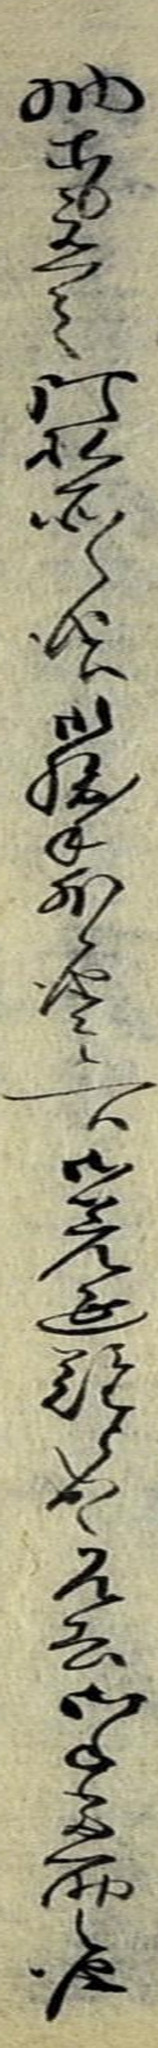納等も有之御札所之儀は御勝手外之儀に候へは御差延難被成候乍去御手当筋之儀
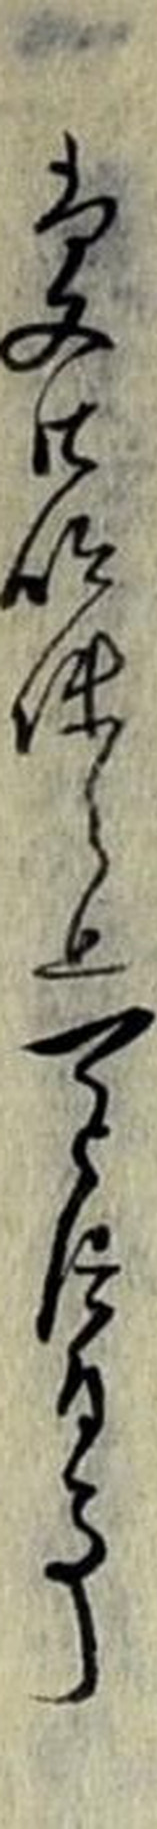尚又御吟味之上可被仰付事
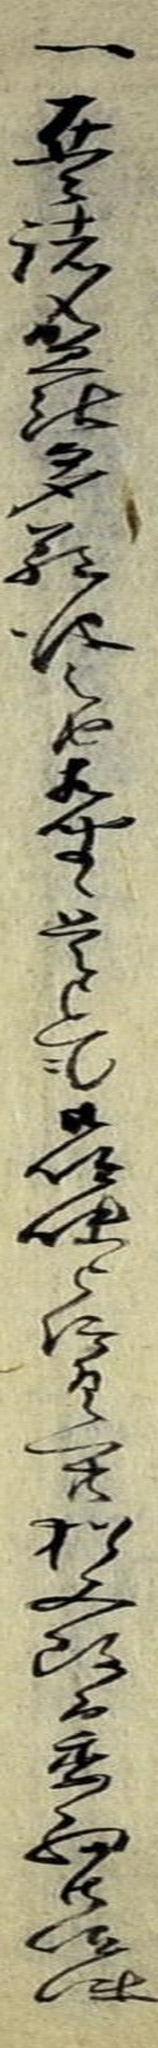一在々諸盛銀多難儀之由相聞候是迄も御吟味被仰付候へ共猶又改而委細御吟味
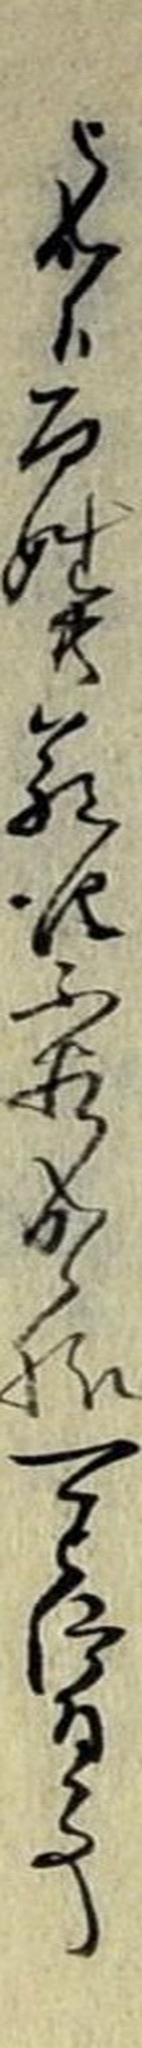被成下百姓共難儀不相成候様可被仰付事
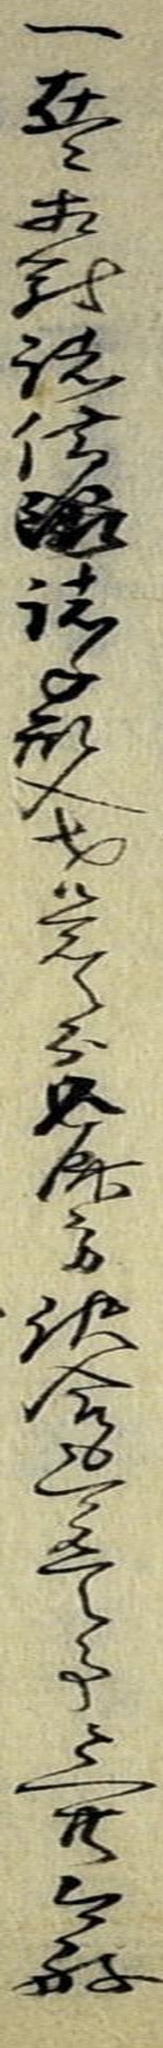一在々相対諸借銀諸手形入才覚之分返済方訳合も可有之事に候へ共今般
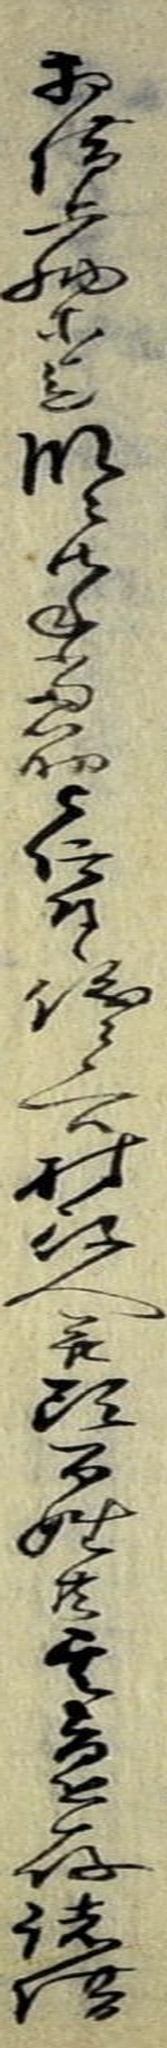拝借上納等迄段々御手当筋被仰付候儀に候へは村役人共頭百姓共其旨を存諸借
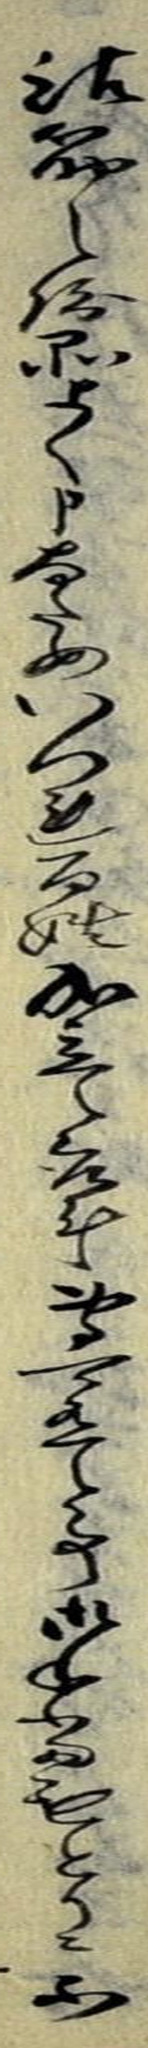銀筋之儀品よく申なためいつれ百姓成立之取斗専可有之事御手当もとりに不
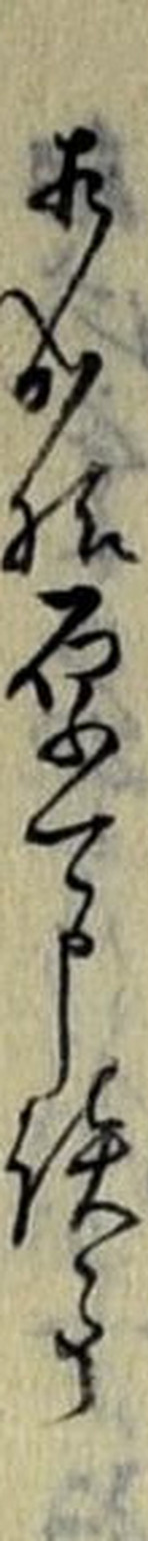相成様厚可申談事
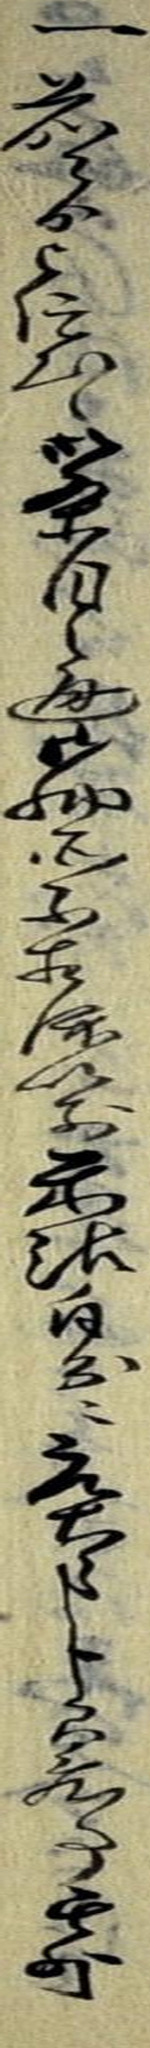一前々ゟ被仰出候御条目之通御納所不相済以前米銀自分に取ちらし申間敷事其外
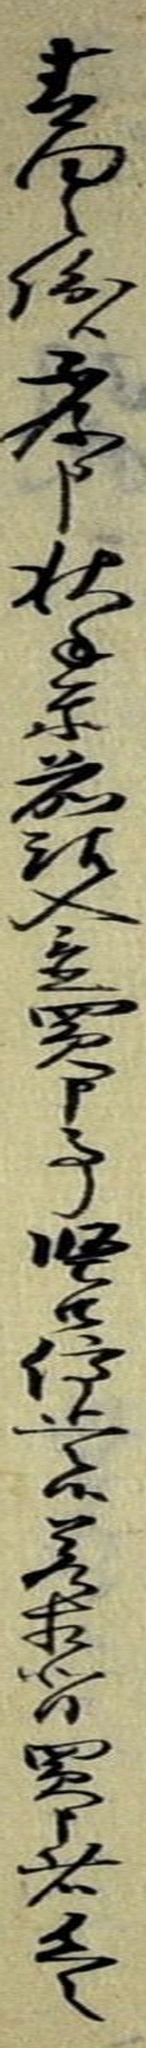青田之儀は不及申秋手米前銀入置買申事堅御停止に候若相背買申有之
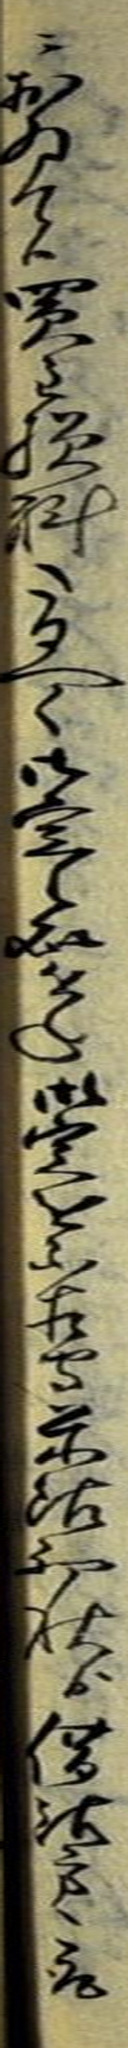におゐては買主損料たるへく御定候処近年御定を不相守米銀初秋ゟ借銀方へ取
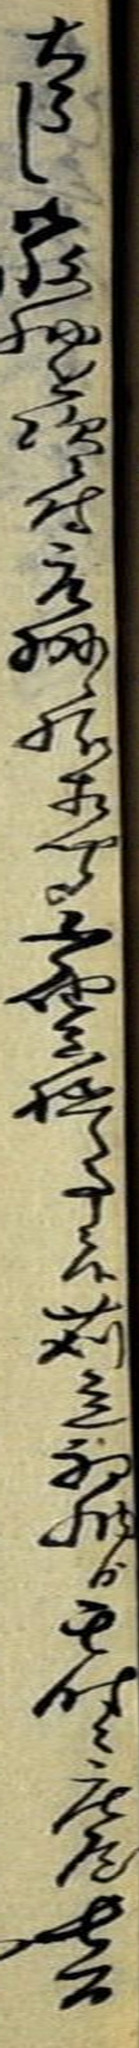ちらし御収納を次に付取扱候様相聞不届至極之事に候苅立初納ゟ其時々庄屋長百
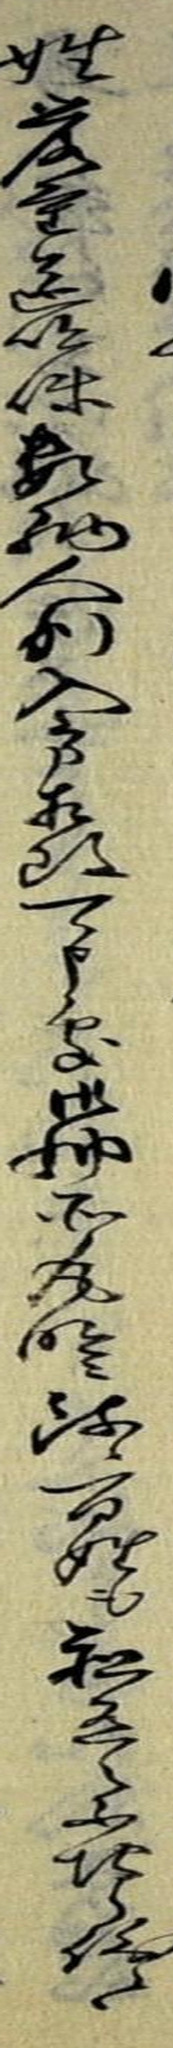姓厳重遂吟味数納人別入方相改可申処御納所丸明に致候百姓も粗有之不埒之儀に候
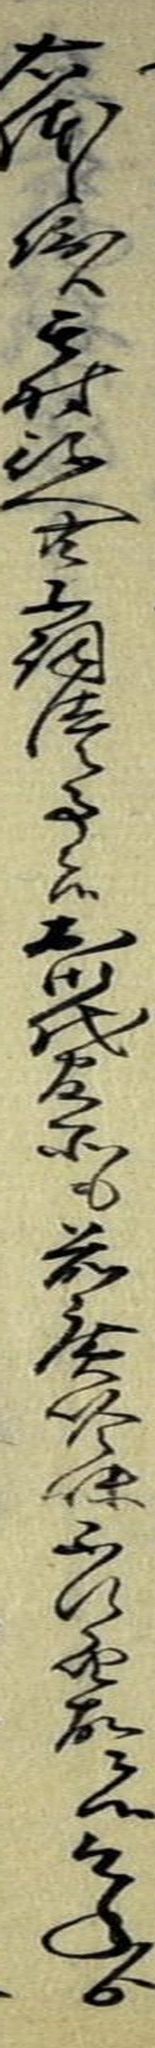右体之儀は其村役人共不調法之事に候於御代官所も前広吟味不行届故に候今年ゟ
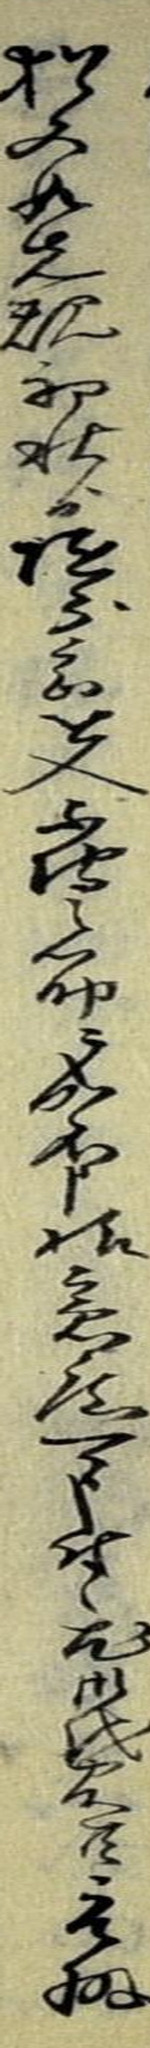猶又如先規初秋ゟ随分念を入不埒之筋に成不申様に急度可申付候尤御代官共取扱
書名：命令之部 二
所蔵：福井県文書館 Fukui Prefectural Archives
